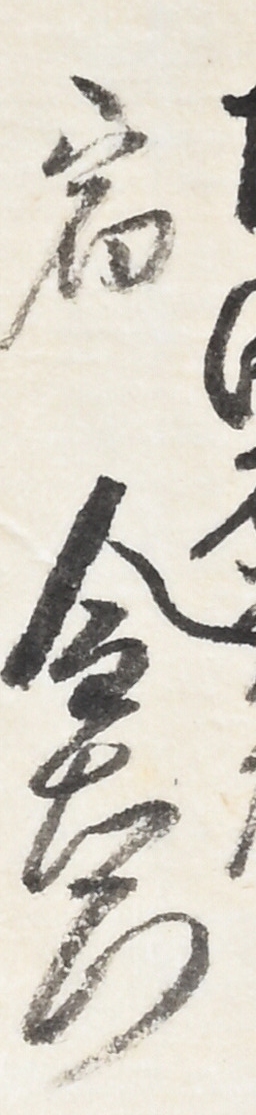宿金右衛門
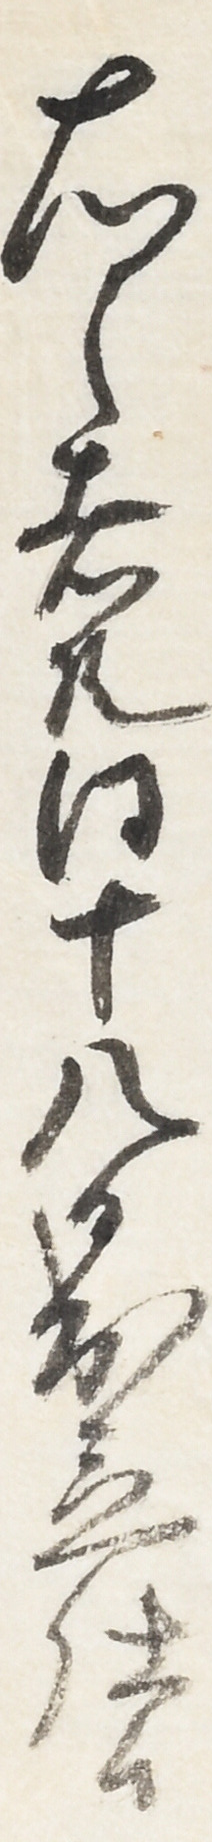右之者共同十八日出立仕候
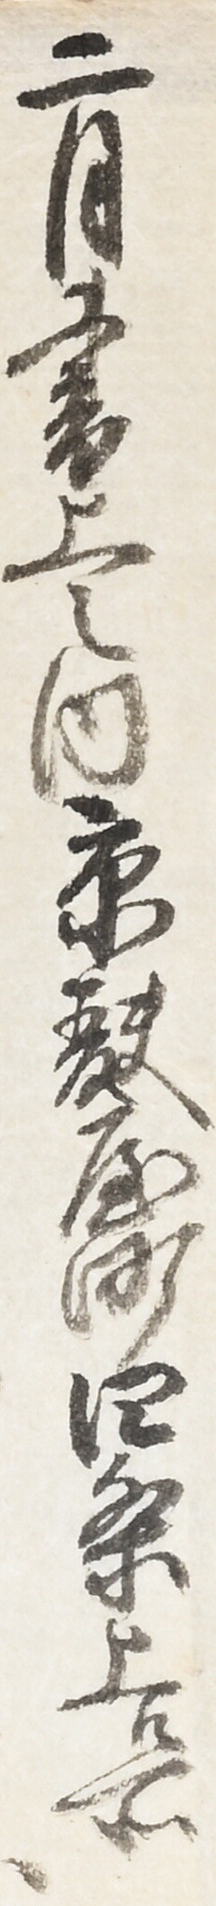二月書上之内京麩屋町四条上ル所
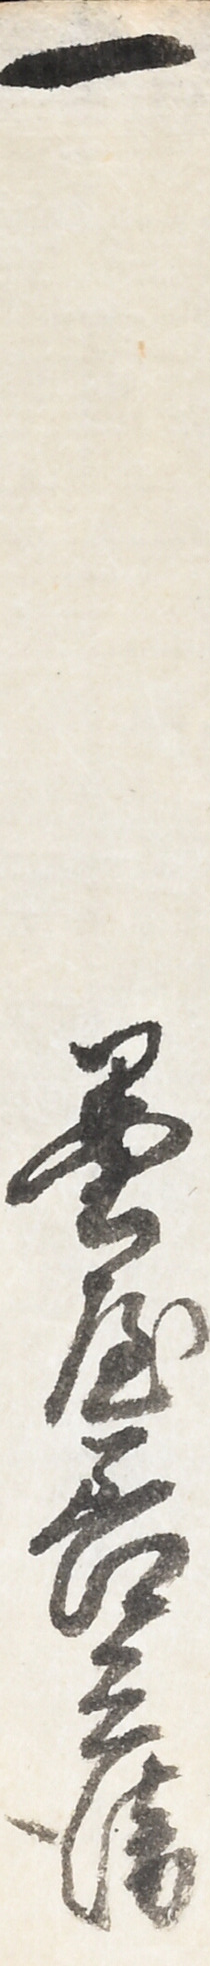一墨屋善兵衛
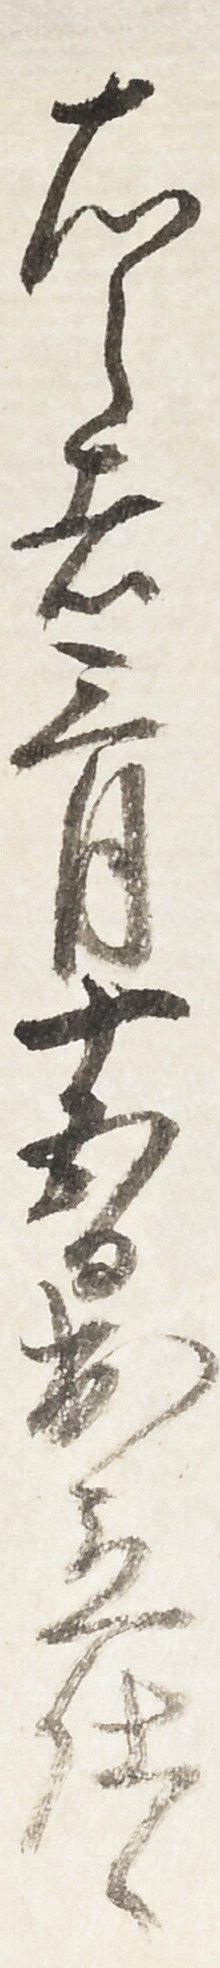右之者三月十五日出立仕候
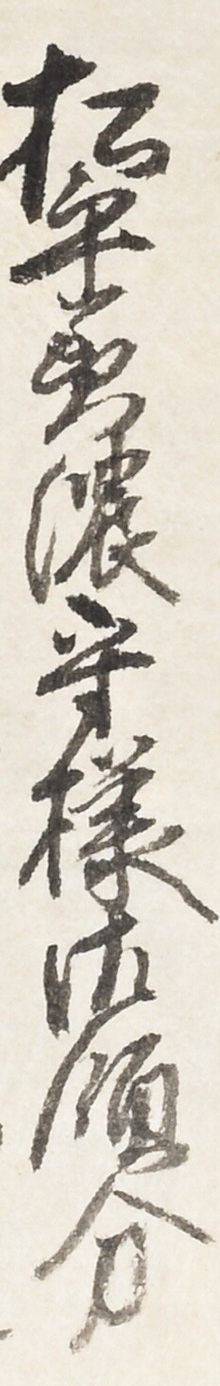松平美濃守様御領分
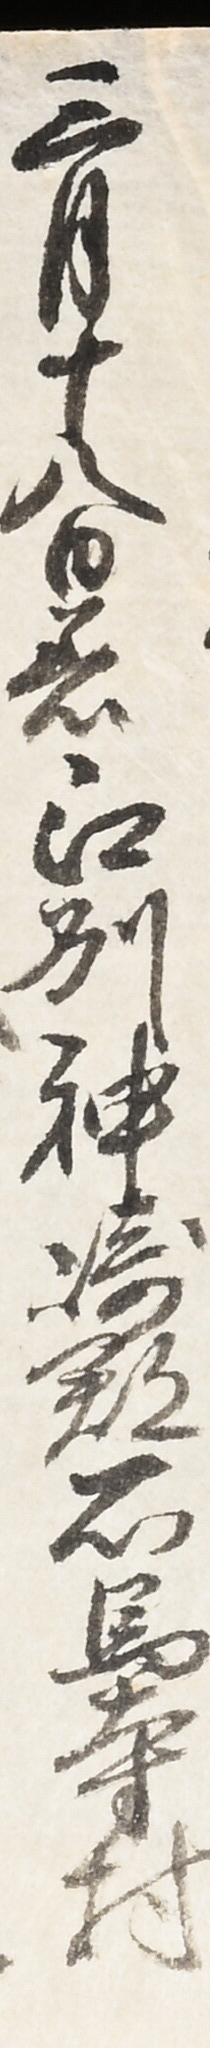三月十八日着江州神崎郡石馬寺村
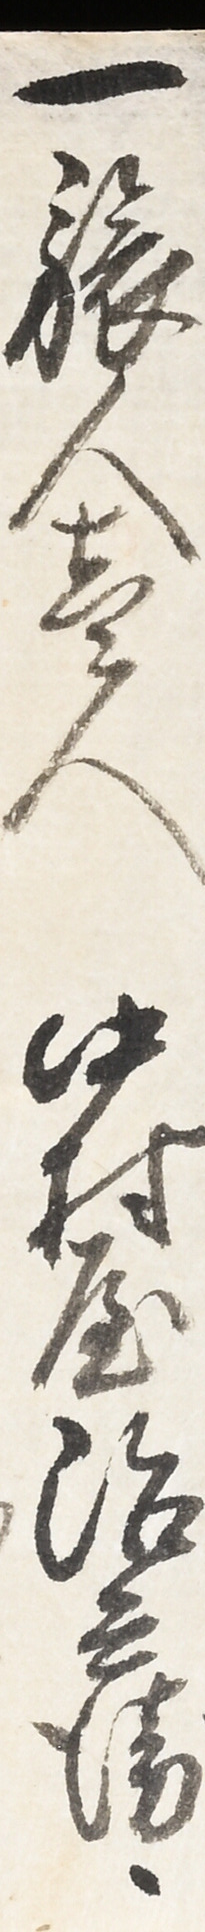一旅人壱人中村屋治兵衛・
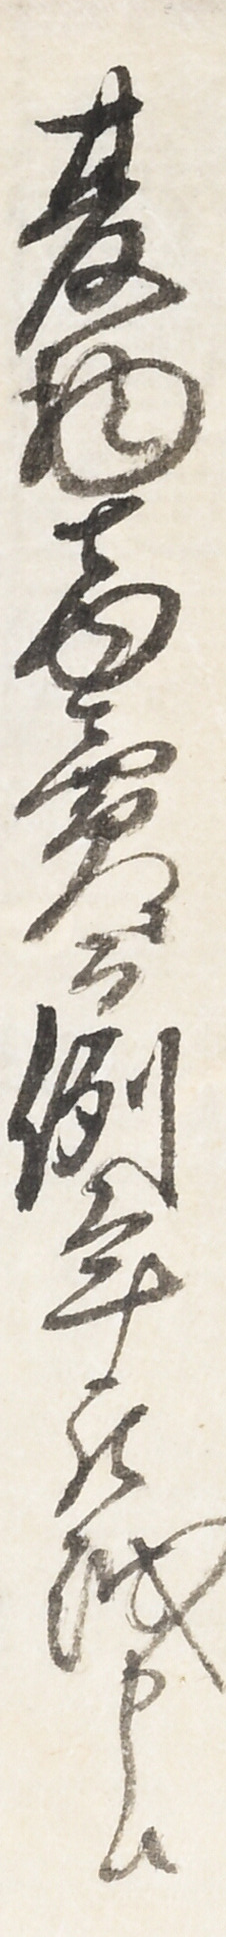夏物商売ニ而例年罷越申候
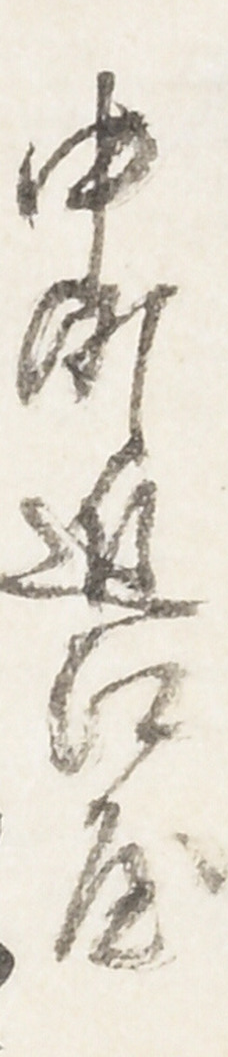中町近江屋
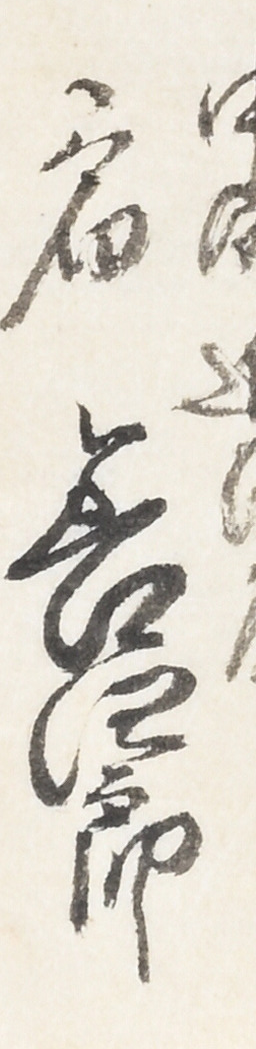宿善四郎
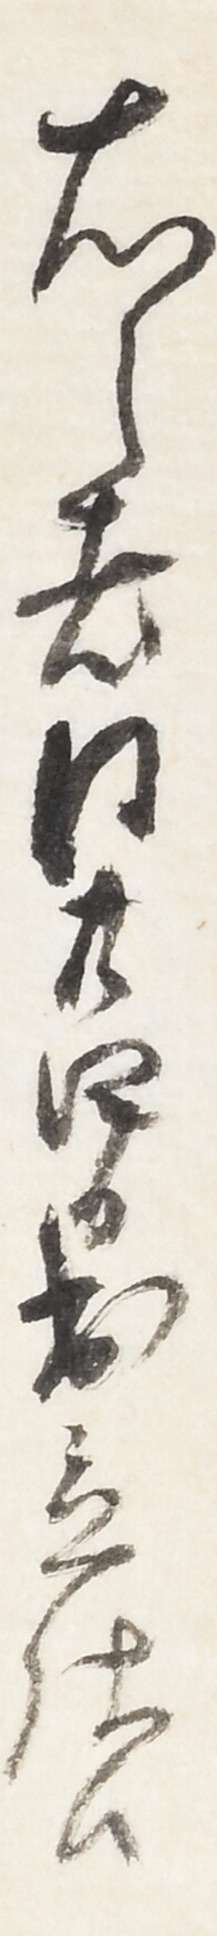右之者同廿四日出立仕候
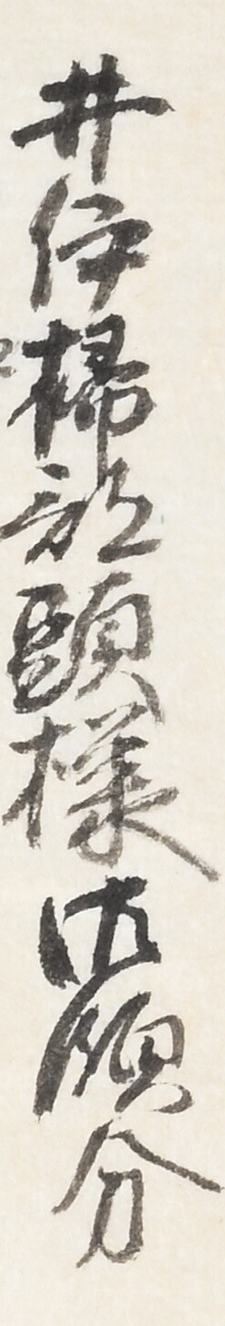井伊掃部頭様御領分
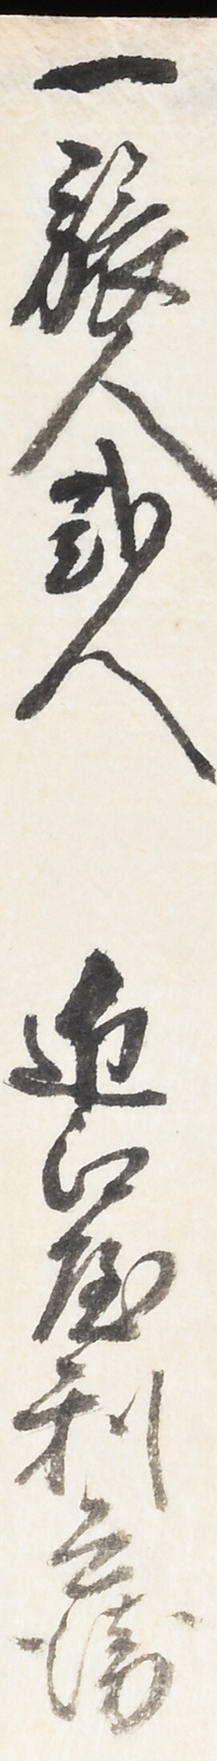一旅人弐人近江屋利兵衛
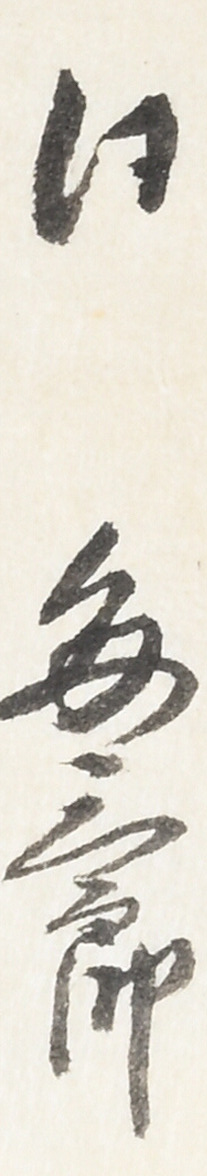同多三郎
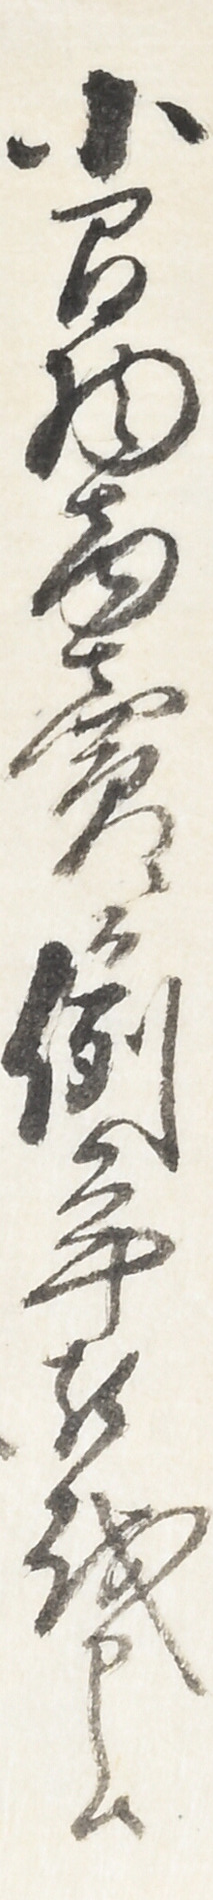小間物商売ニ而例年罷越申候
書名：旅人泊控帳
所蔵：伊那市立高遠町図書館・合同会社AMANE
